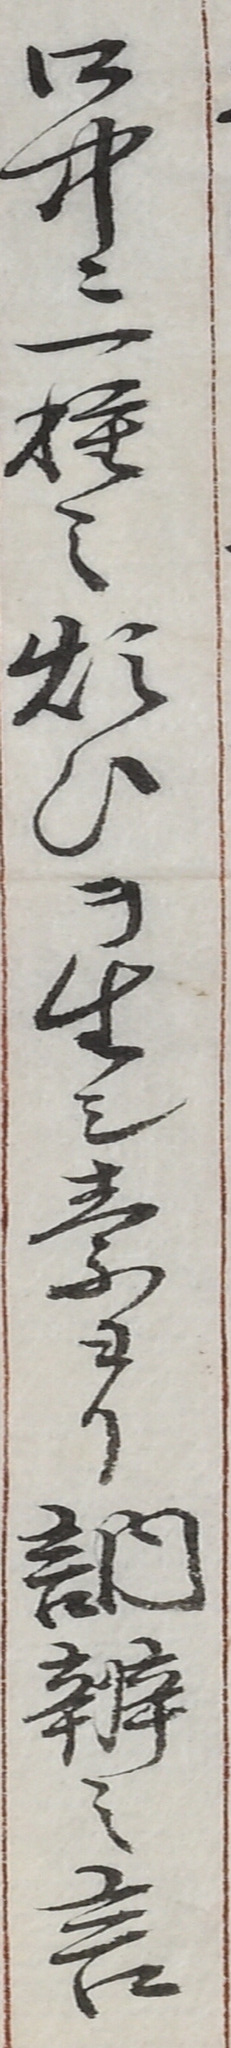口中ニ一種之煩ひヲ生シ素ヨリ訥弁之言
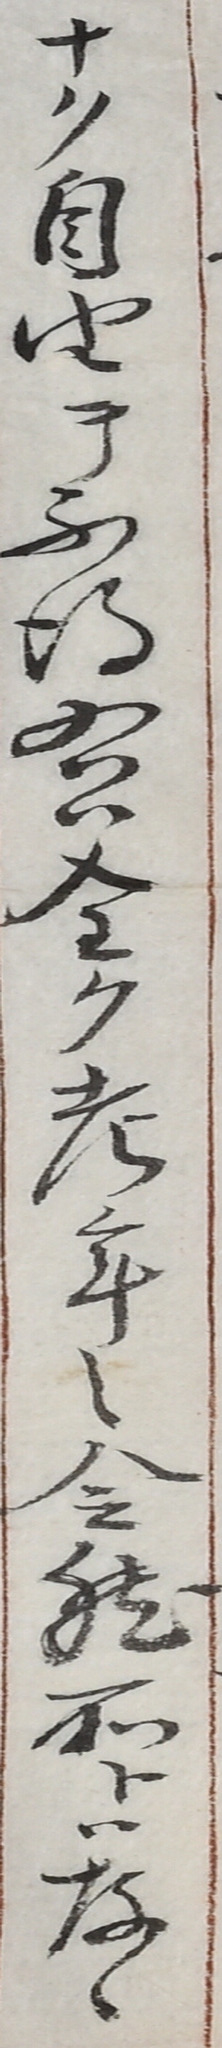ナク自由ヲ不得右は全ク老年之令然所トハ存候
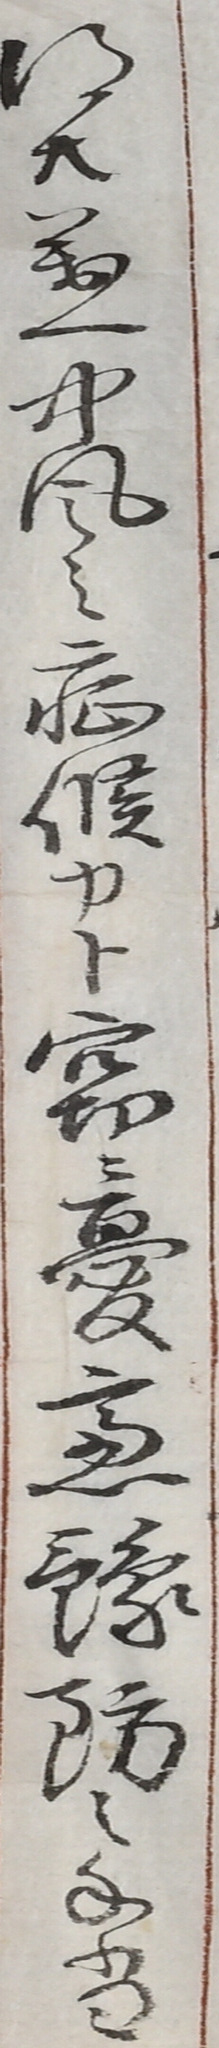得共万一中風之症候カト窃ニ憂慮予防之手当

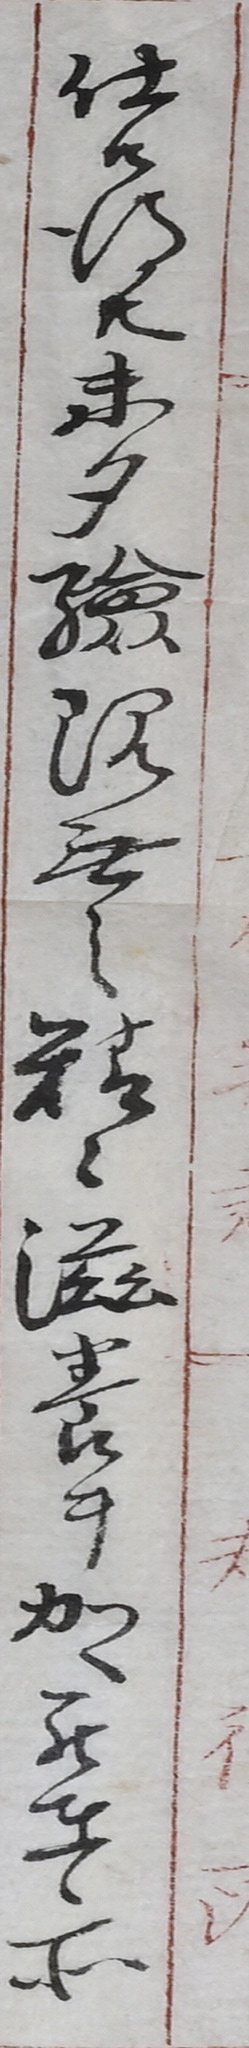仕候得共未夕験限無之精々滋養ヲ加へ罷在候所
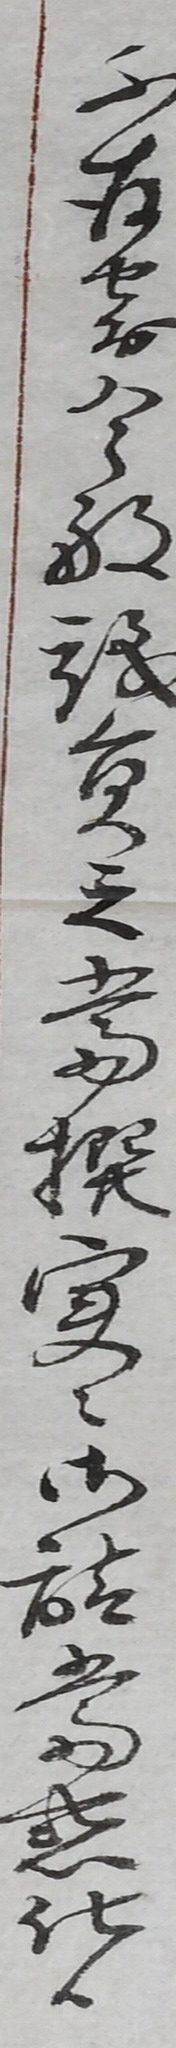不存寄今般議員之当撰実ニ御請当惑仕候
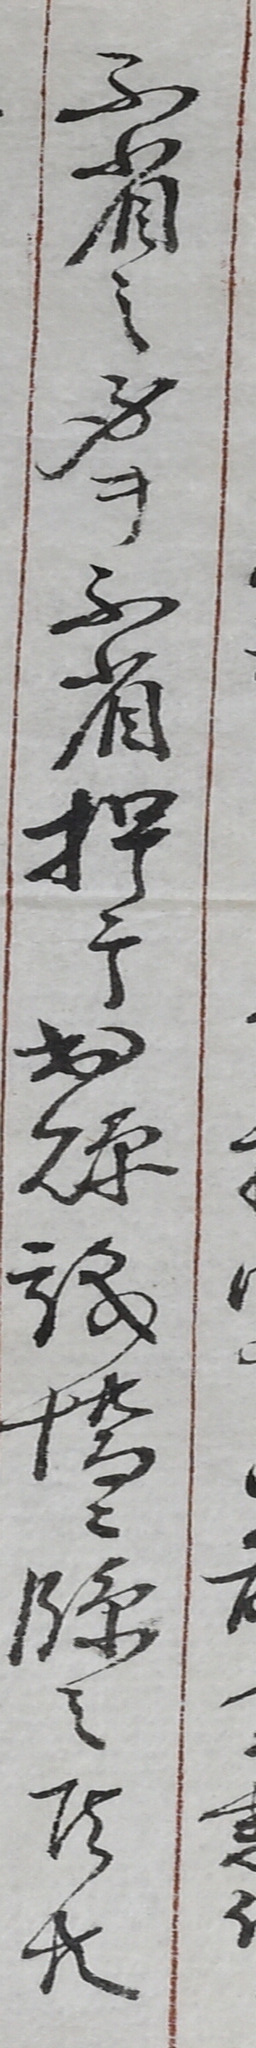不肖之身ヲ不省押テ出県議場ニ臨ミ候共
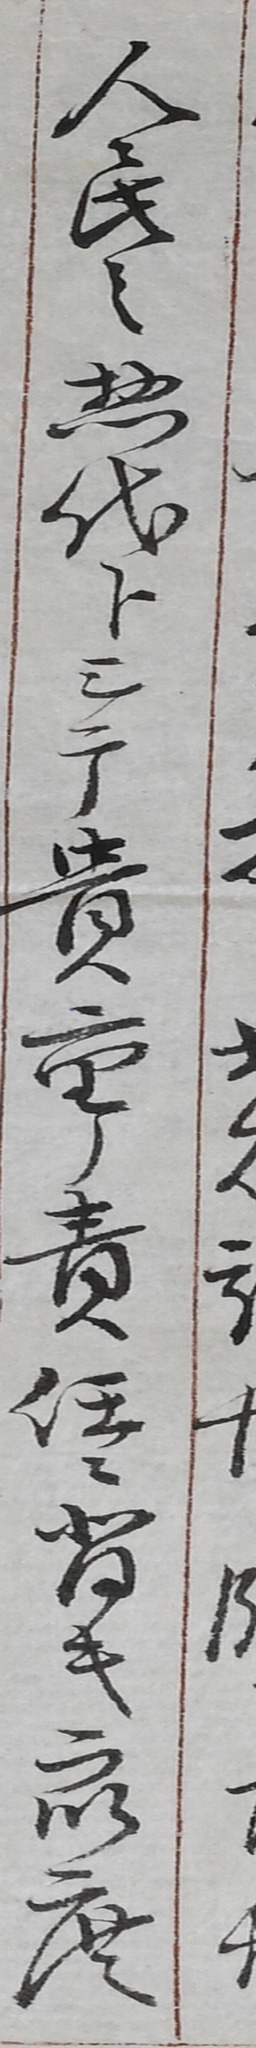人民之惣代トシテ貴重ノ責任ニ背キ衆庶
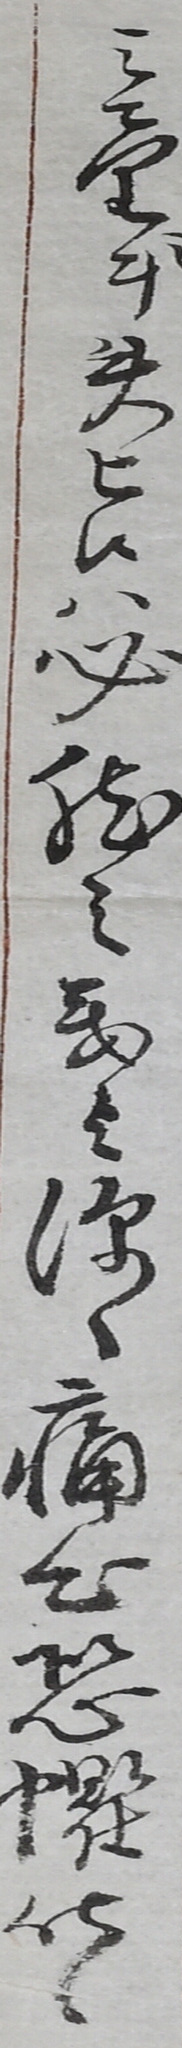之望ミヲ失ヒ候ハ必然之義と深く痛心恐懼仕候
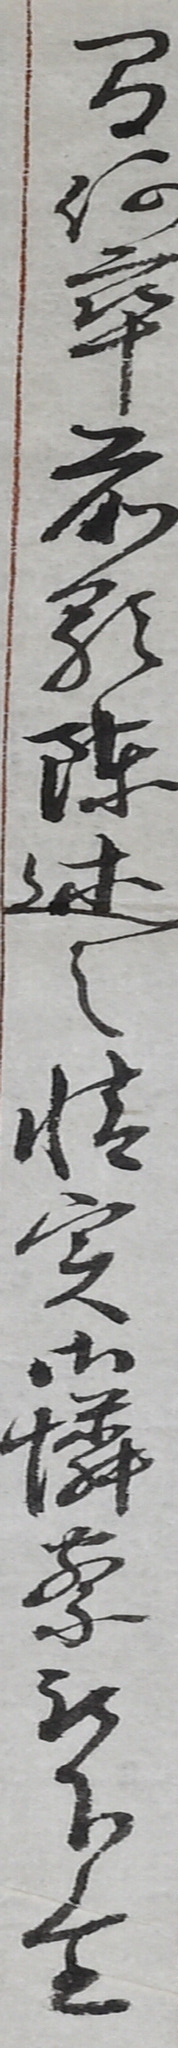間何卒前顕陳述之情実御憐察被下置
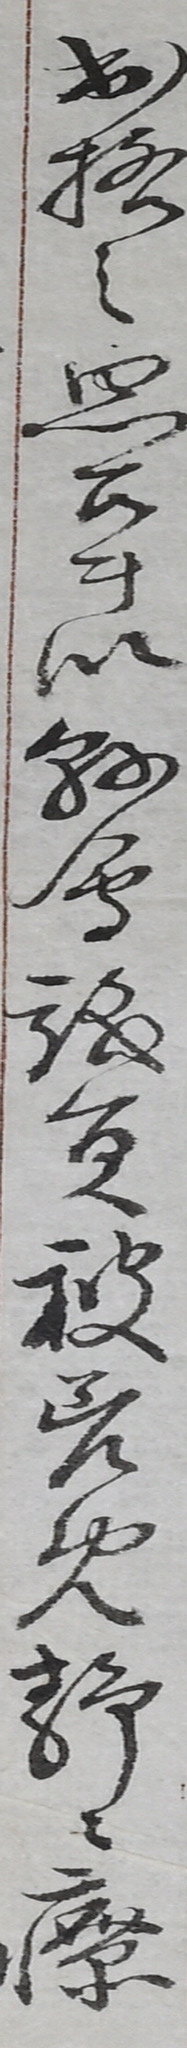出格之思召ヲ以県会議員被差免静に療
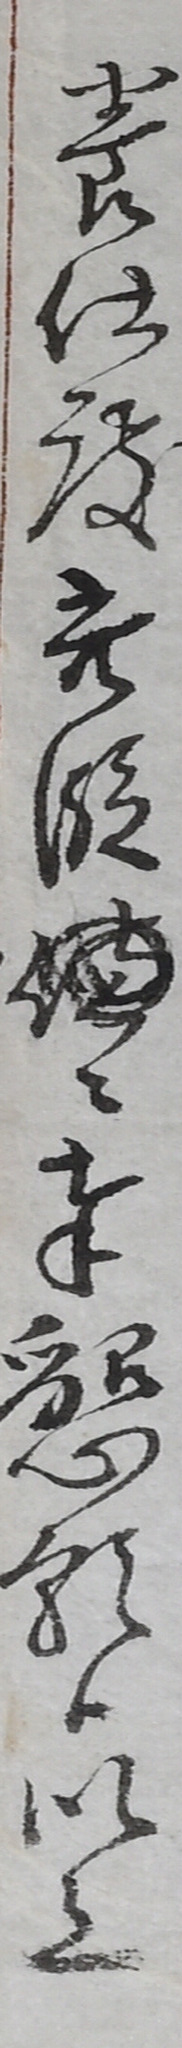養仕度此段●ニ奉懇願候以上
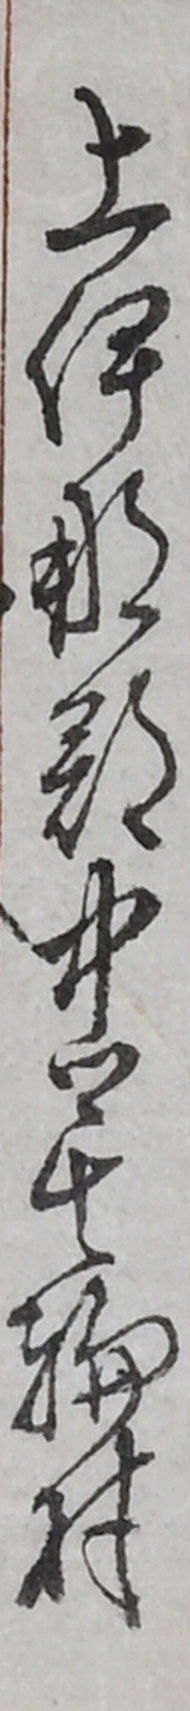上伊那郡中箕輪村
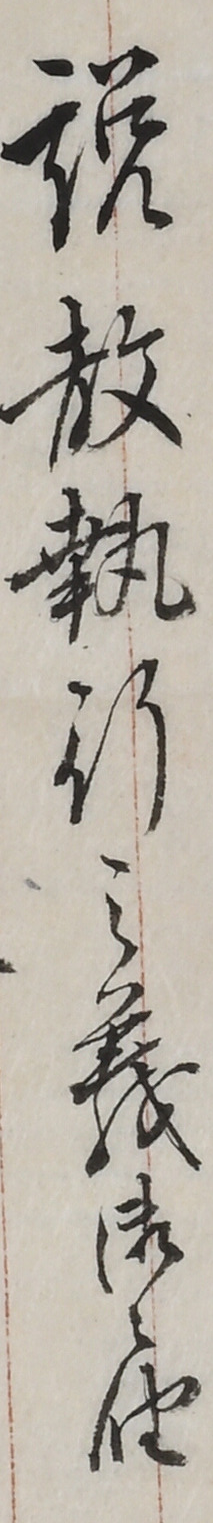説教執行之義御届
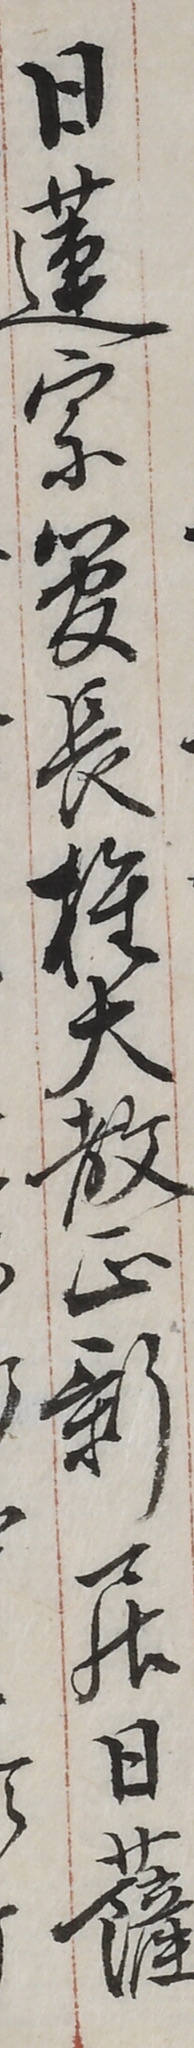日蓮宗管長権大教正新居日薩
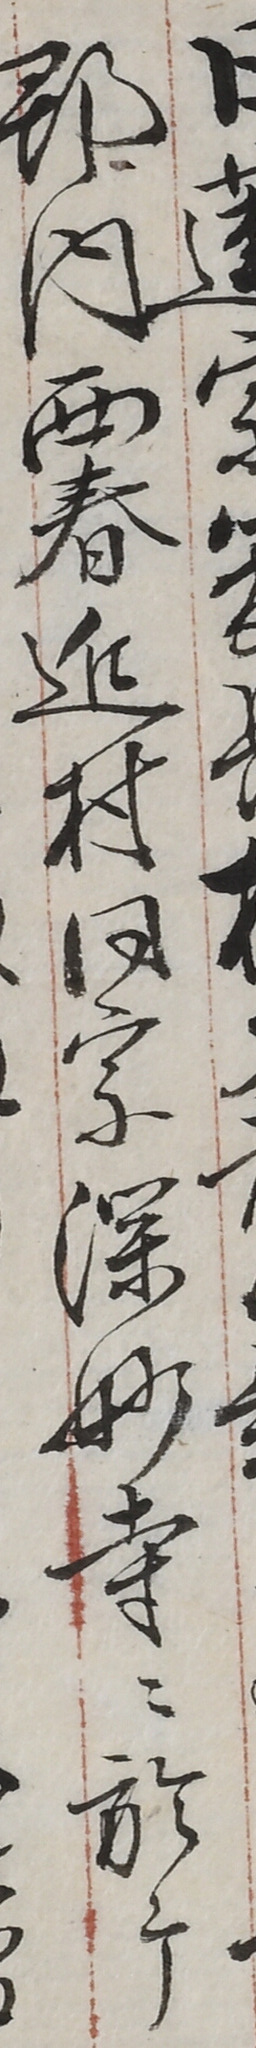郡内西春近村同宗深妙寺ニ於テ
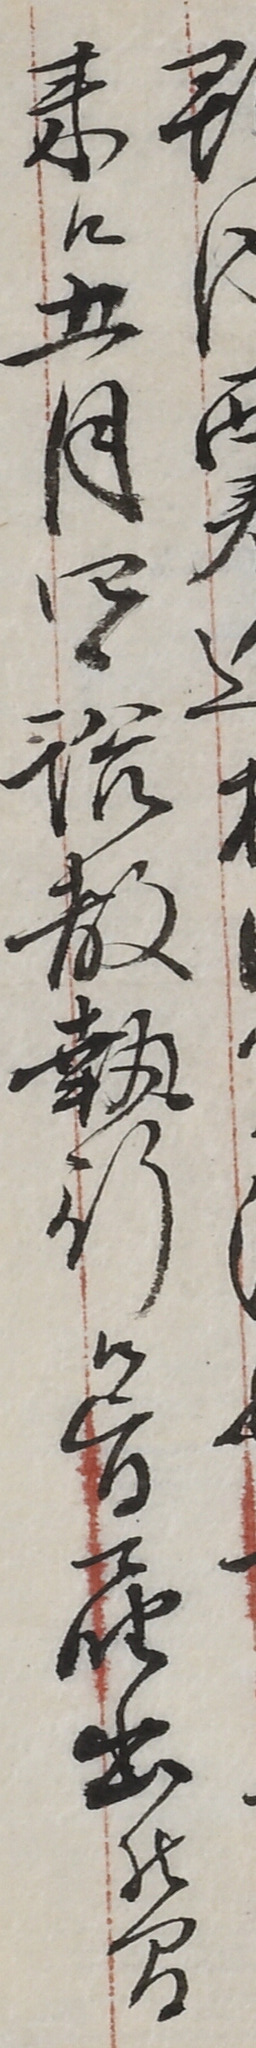来ル五月四日説教執行候旨届出候間
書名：郡役所勤務中御用抜書
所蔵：伊那市立高遠町図書館・合同会社AMANE
